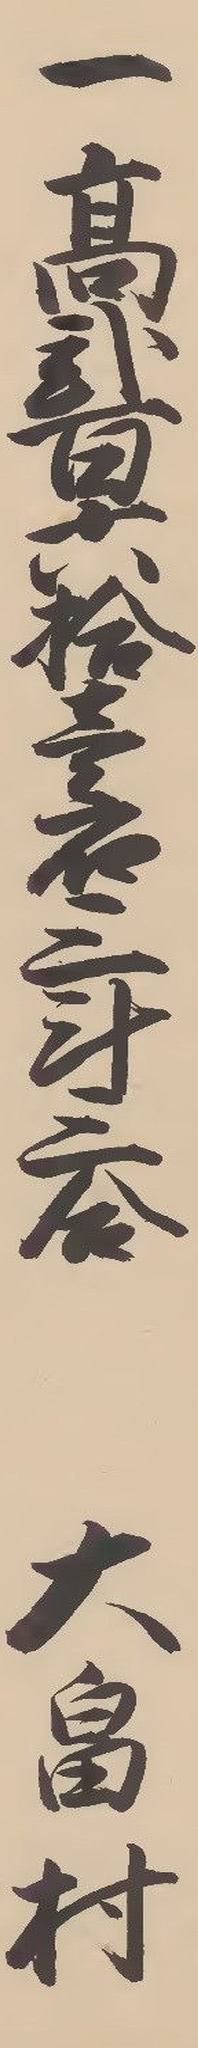一高弐百六拾壱石三斗三合大畠村
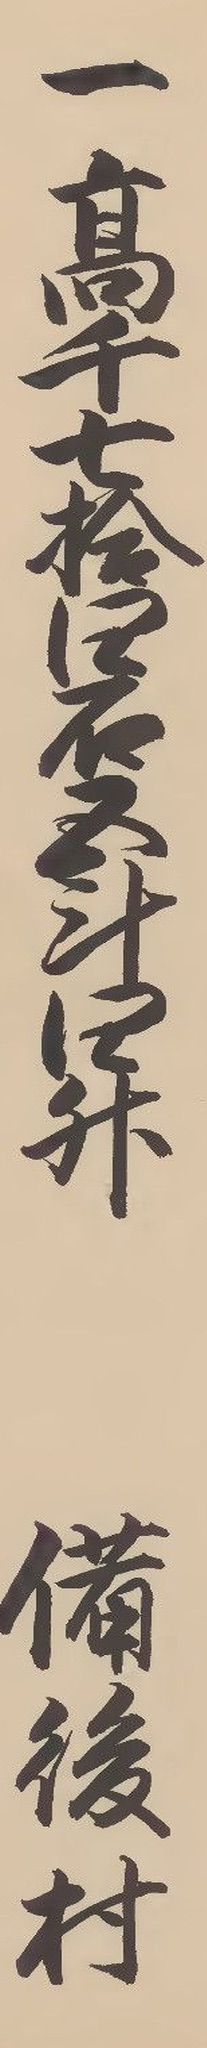一高千七拾四石五斗四升備後村
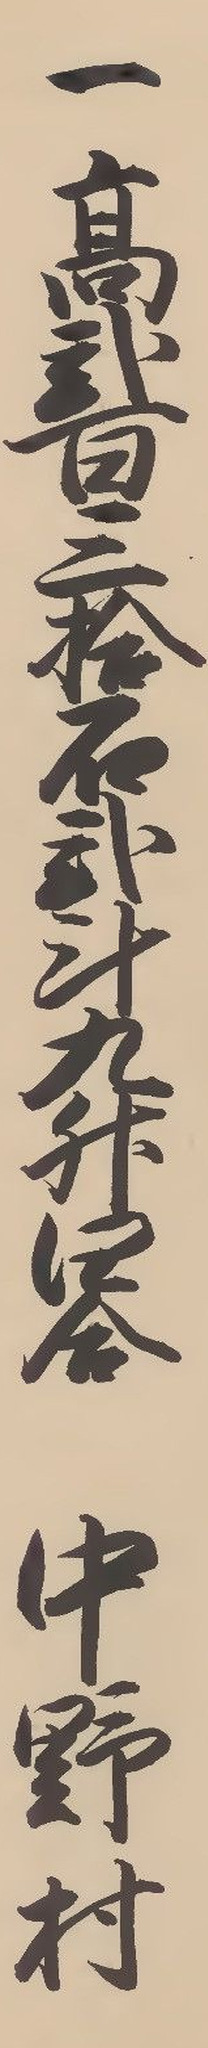一高弐百三拾石弐斗九升四合中野村
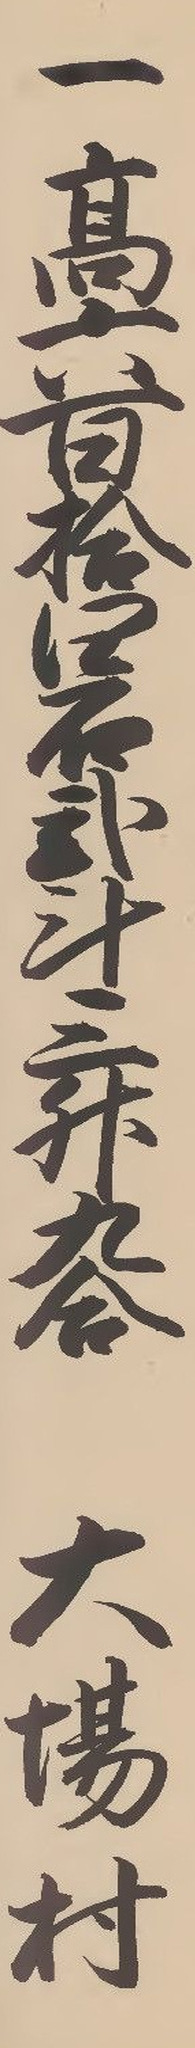一高六百拾四石弐斗三升九合大場村
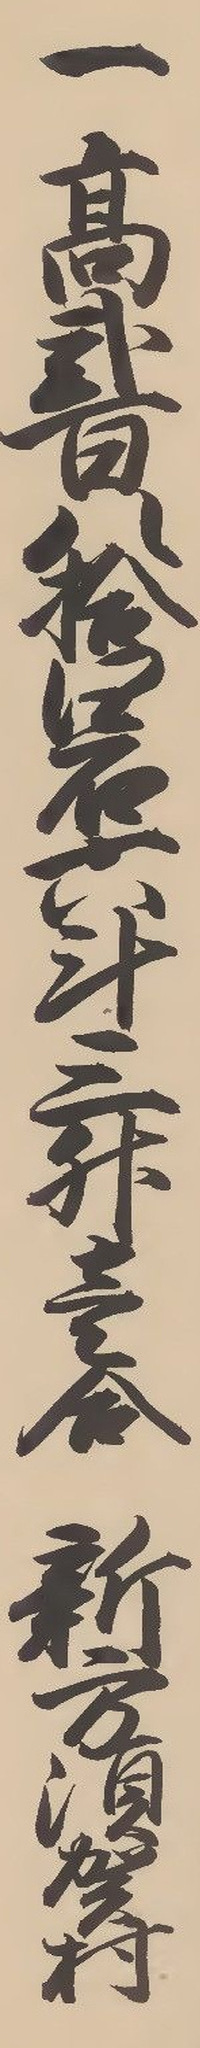一高弐百八拾四石六斗三升壱合新方須賀村
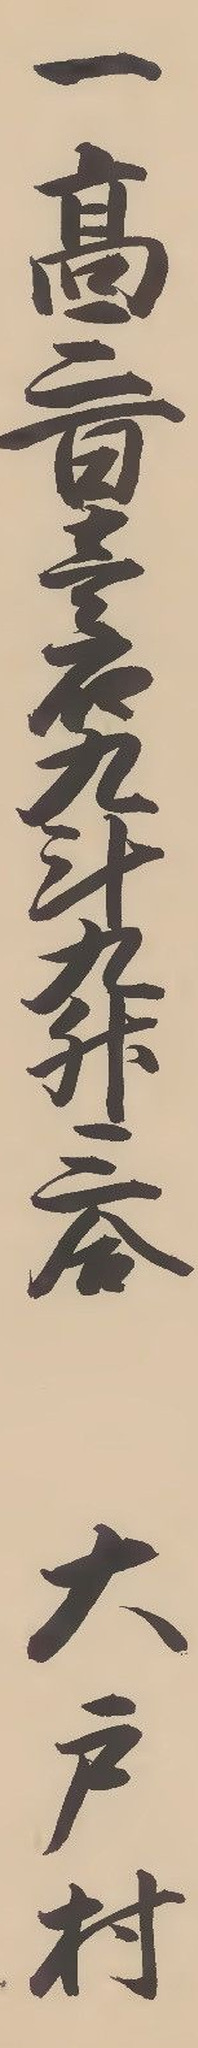一高三百壱石九斗九升三合大戸村
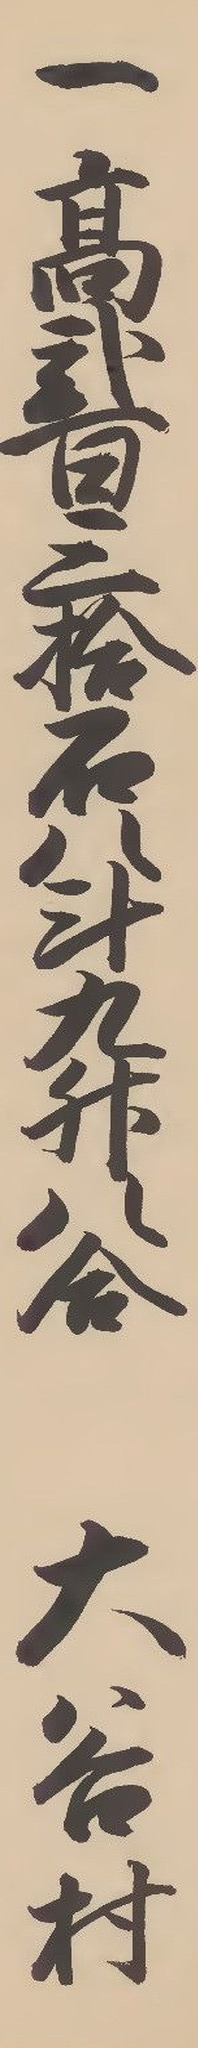一高弐百三拾石八斗九升八合大谷村
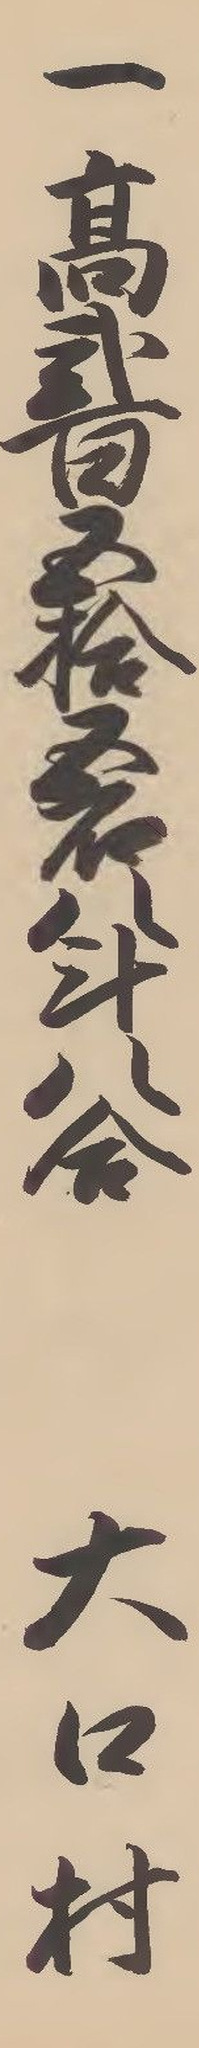一高弐百五拾五石八斗八合大口村

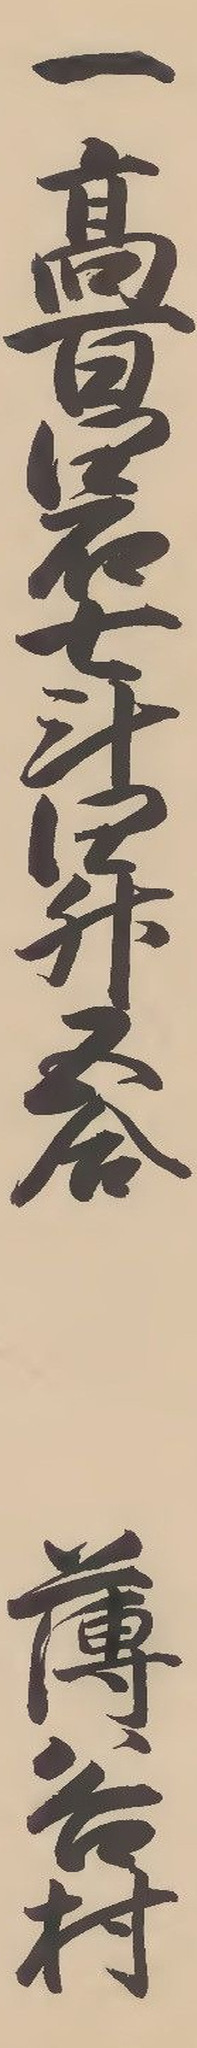一高百四石七斗四升五合薄谷村
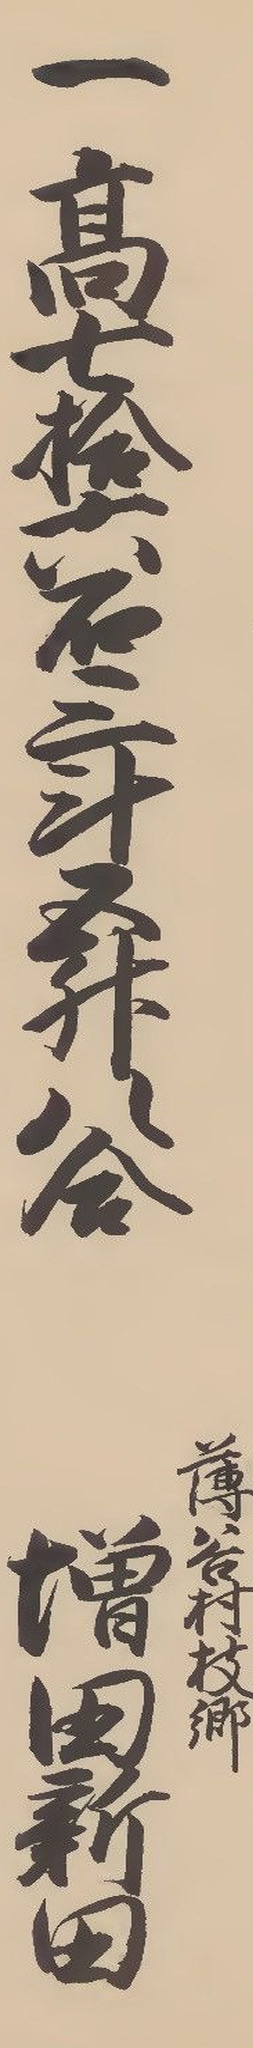一高七拾六石三斗五升八合増田新田
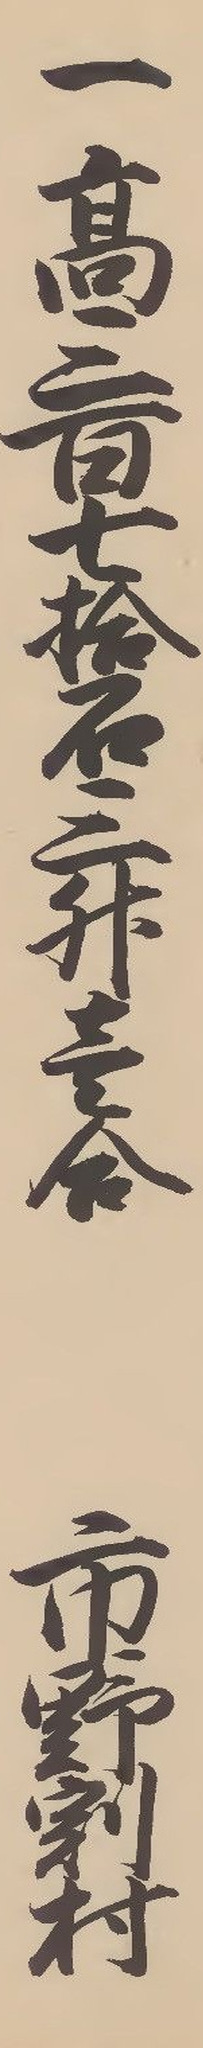一高三百七拾石三升壱合市野割村
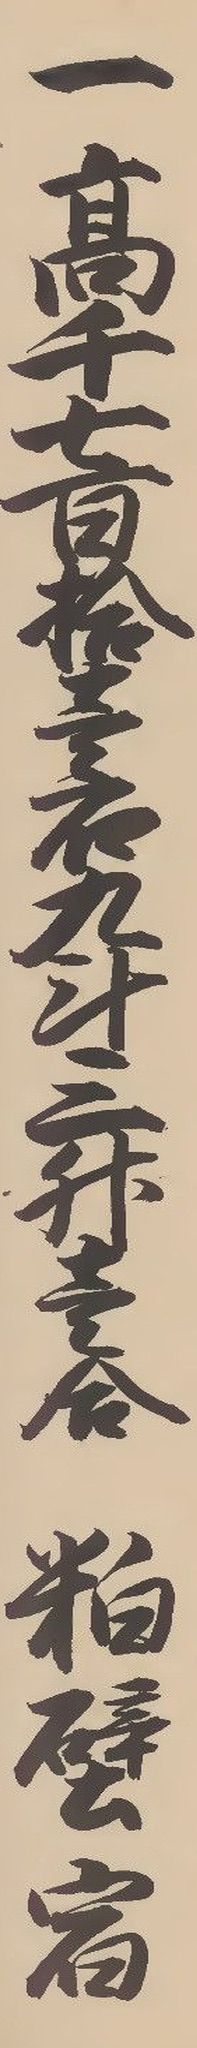一高千七百拾壱石九斗三升壱合粕壁宿
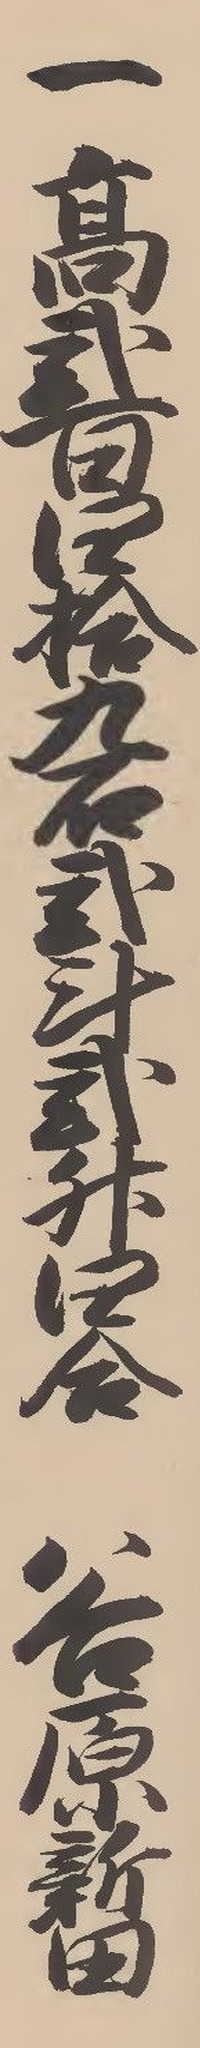一高弐百四拾九石弐斗弐升四合谷原新田
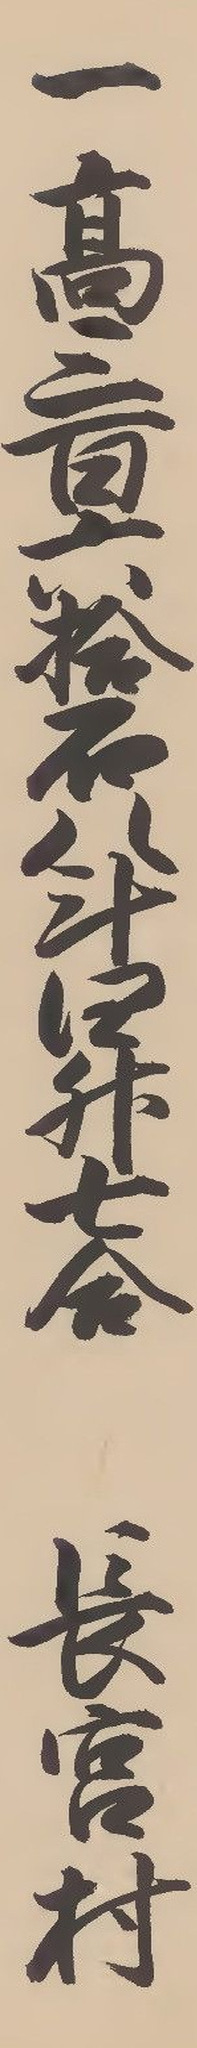一高三百六拾石八斗四升七合長宮村
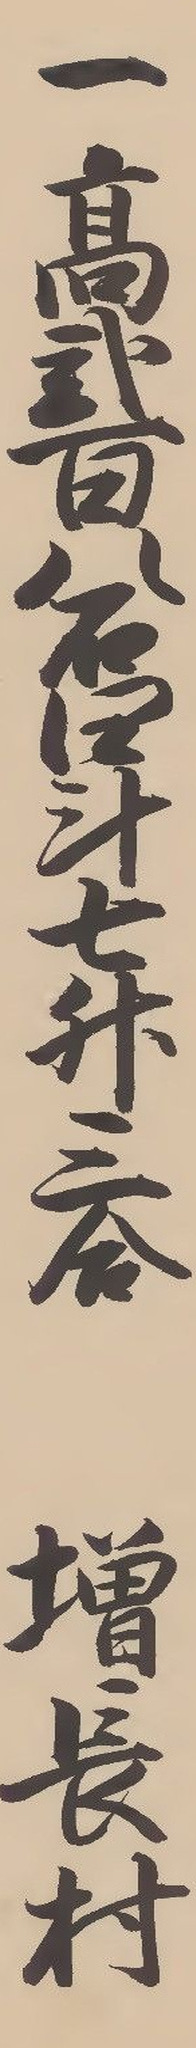一高弐百八石四斗七升三合増長村
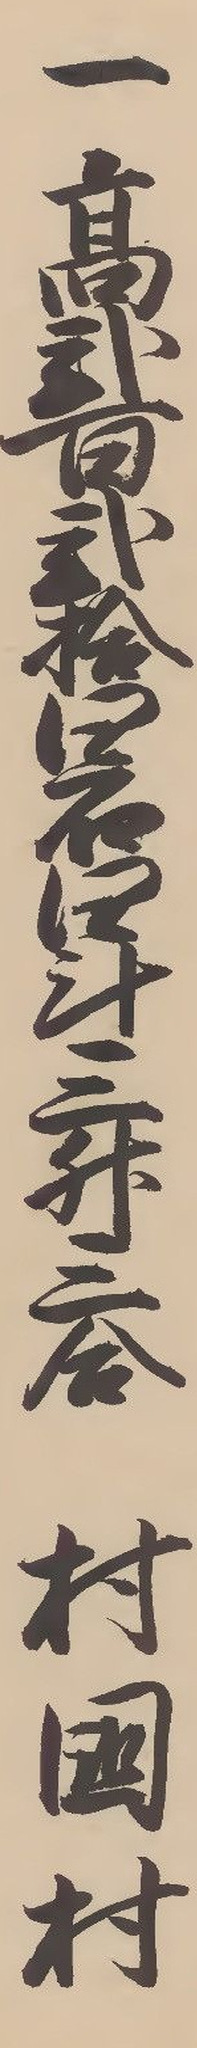一高弐百弐拾四石四斗三升三合村国村
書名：武蔵国郷帳　下
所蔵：国立公文書館 National Archives of Japan
